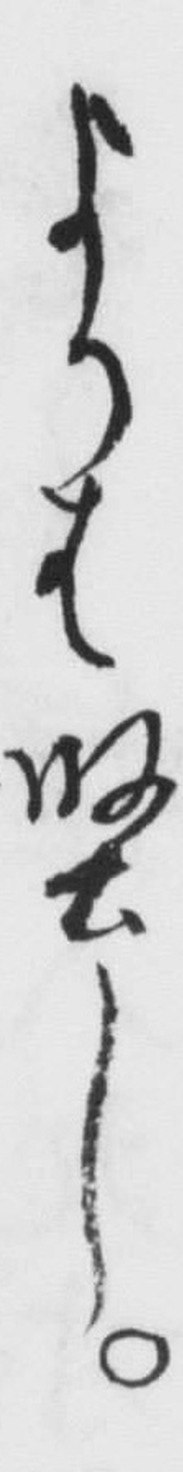よりは堅し。
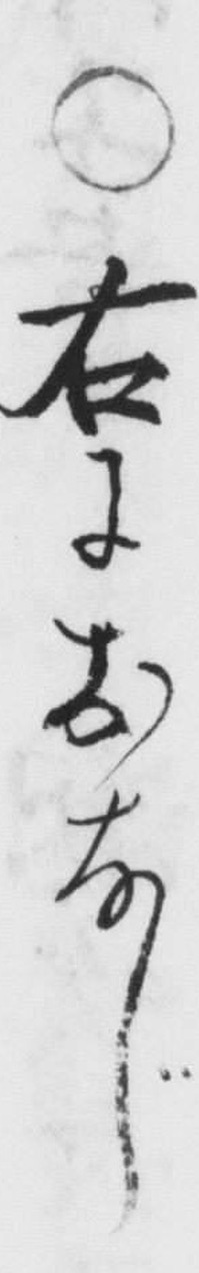○右におなじ

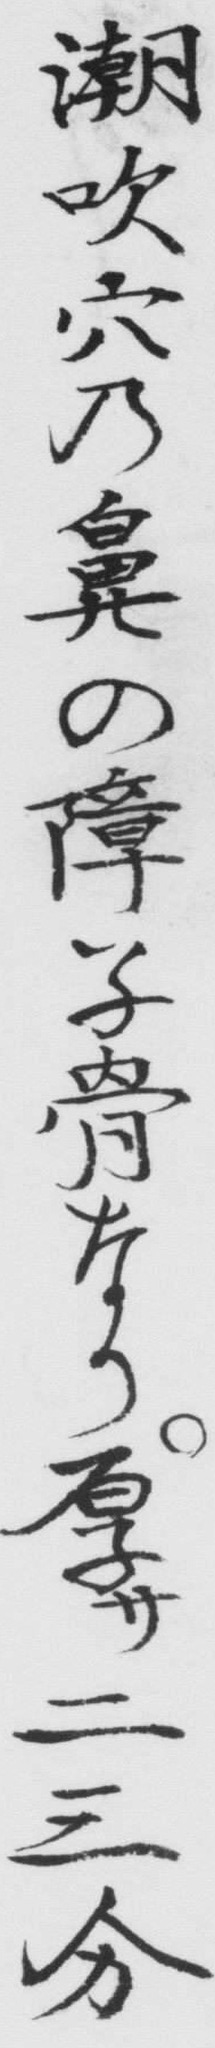障子骨潮吹穴の鼻の障子骨なり。厚サ二三分
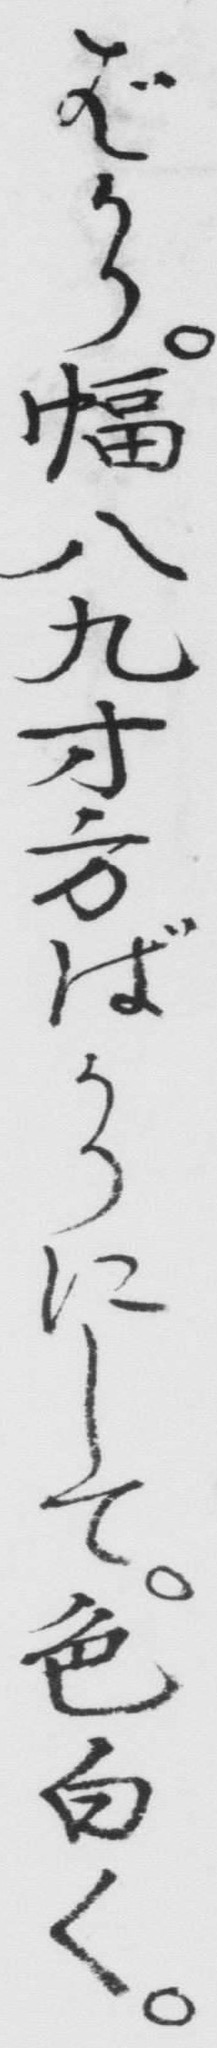ばかり。幅八九寸方ばかりにして。色白く。
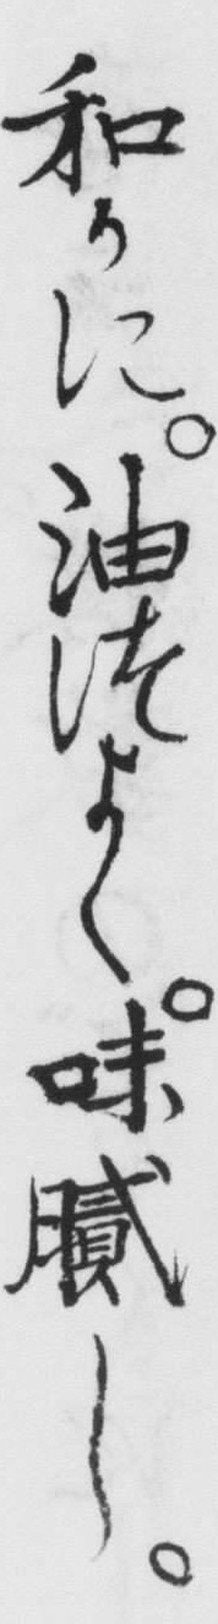和かに。油強く。味膩し。
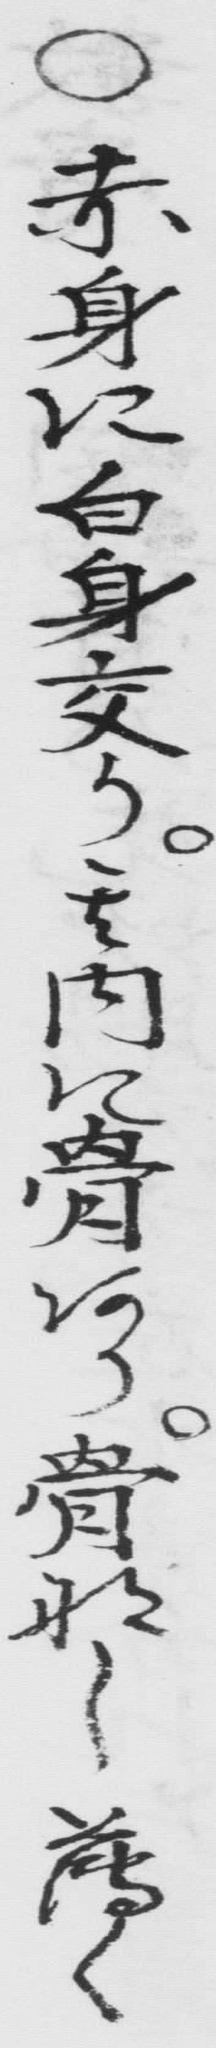○赤身に白身交り。其内に骨あり。骨なし薄く
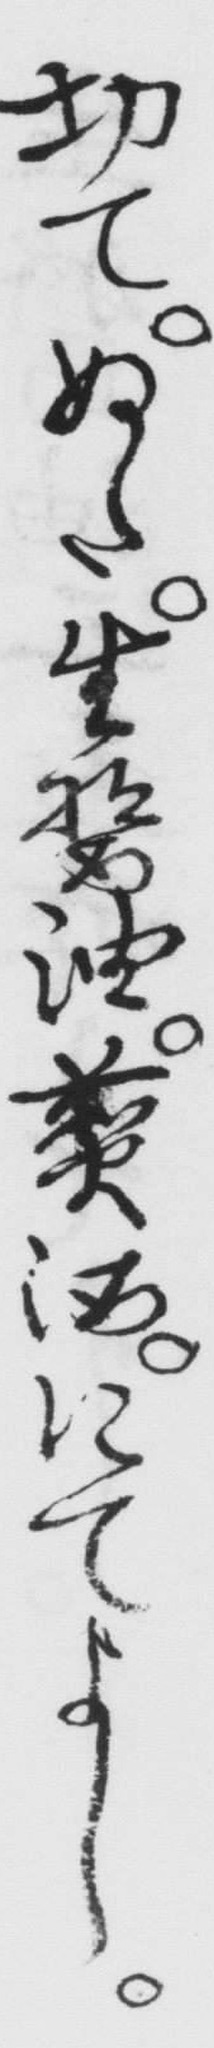切て。ぬた。生醤油。煎酒。にてよし。
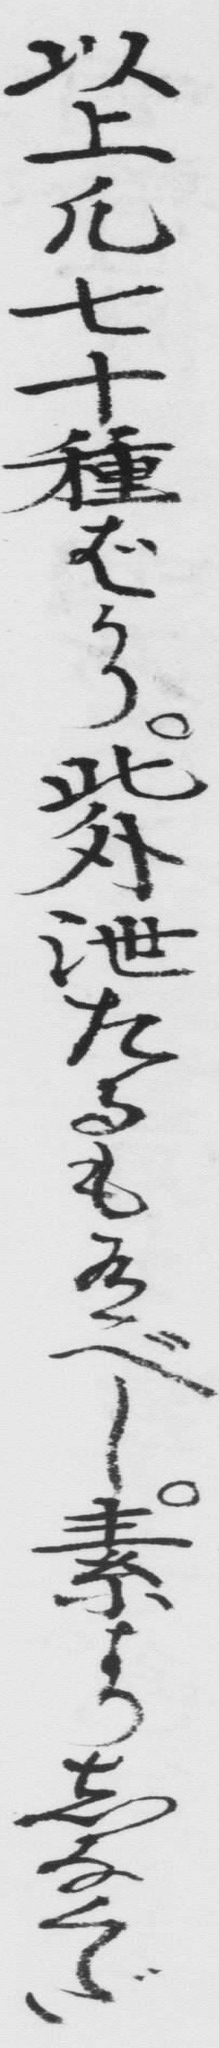以上凡七十種ばかり。此外泄たるも有べし。素よりしなくだ
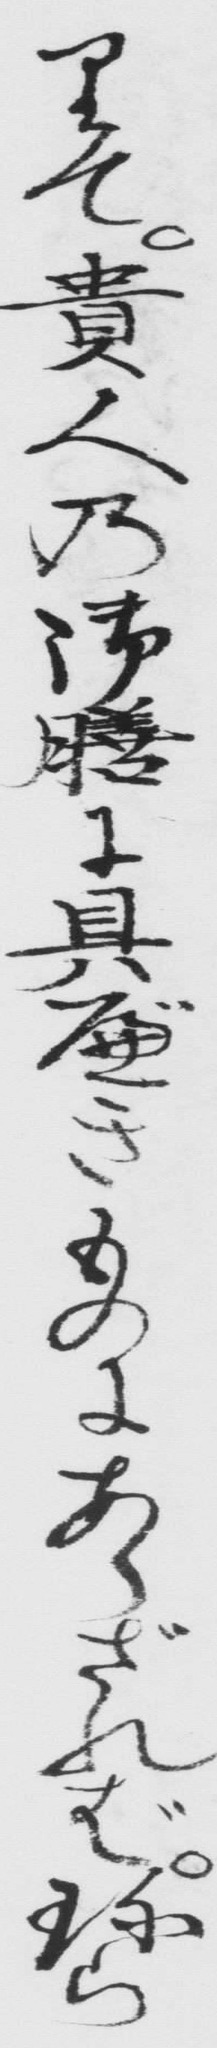りて。貴人の御膳に具べきものにあらざれば。珍ら
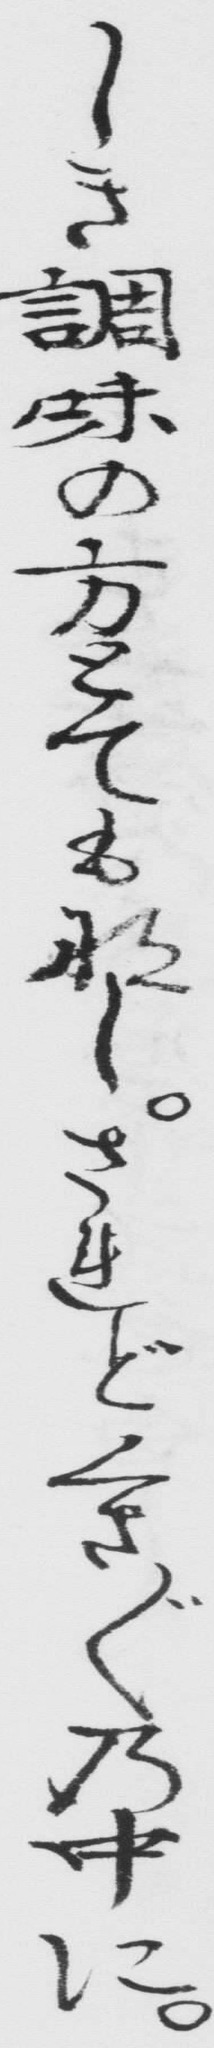しき調味の方とてもなし。されどくさ〴〵ぐさの中に。
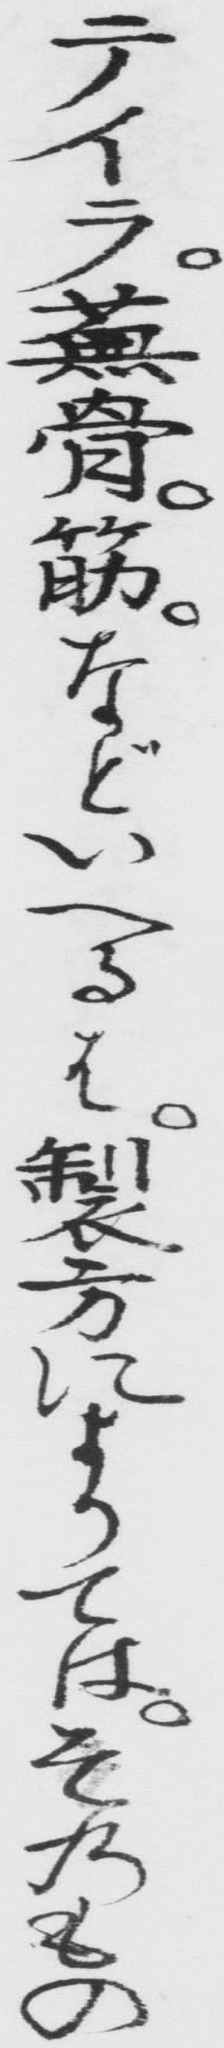テイラ。蕪骨。筋。などいへるは。製法によりては。そのもの
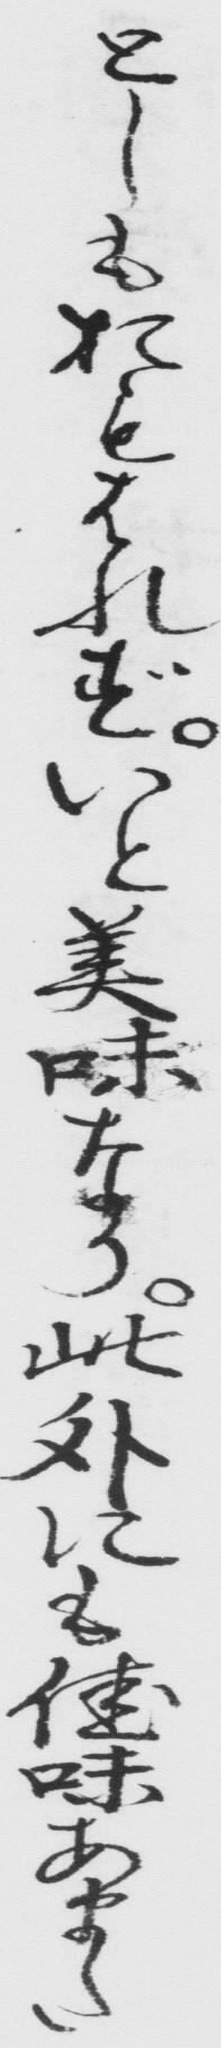としもおもはれず。いと美味なり。此外にも佳味あまた
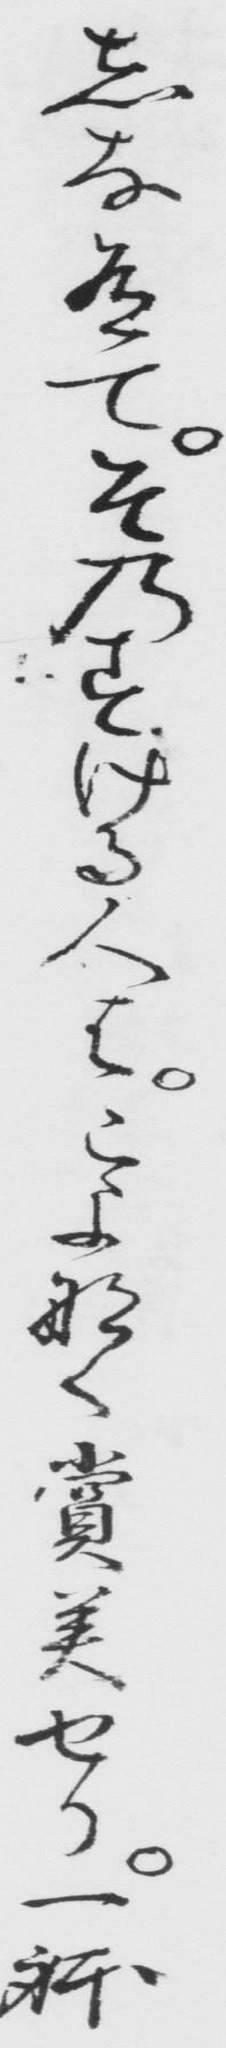しな有て。そのすける人は。こよなく賞美せり。一体
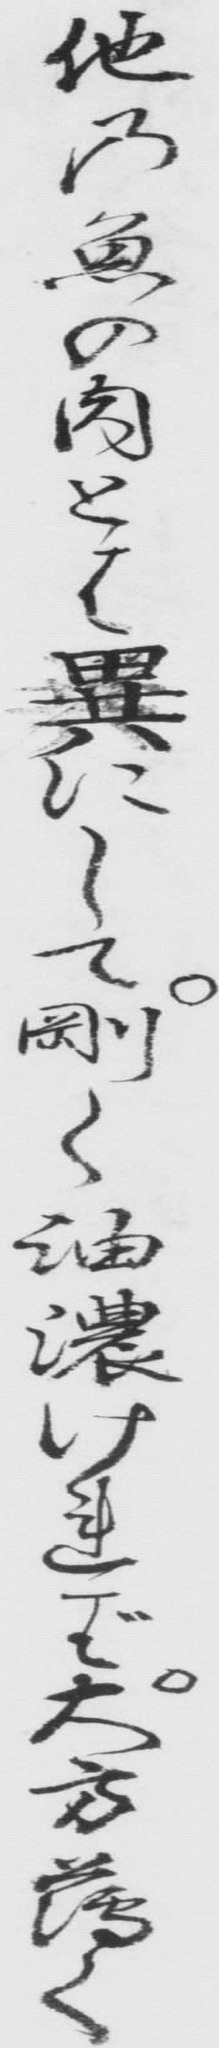他の魚の肉とは異にして。剛く油濃ければ。大方薄く
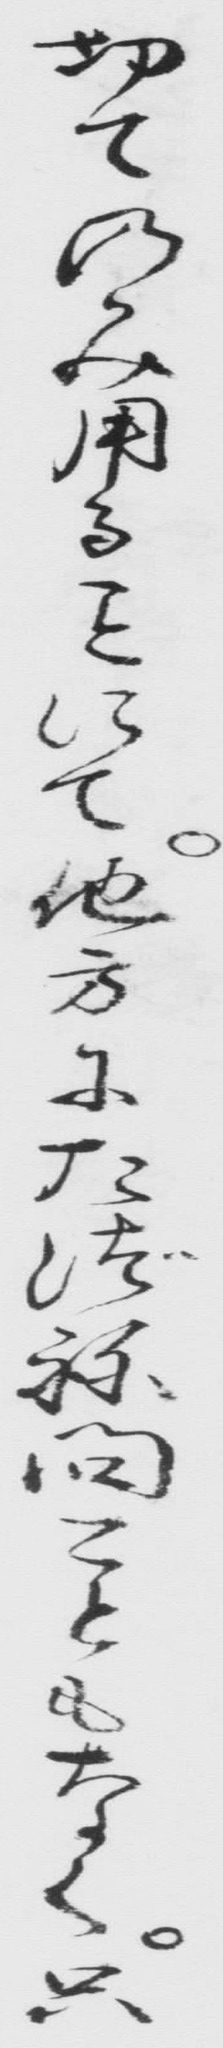切てのみ用ることにて。他方にたづね問こともなく。只
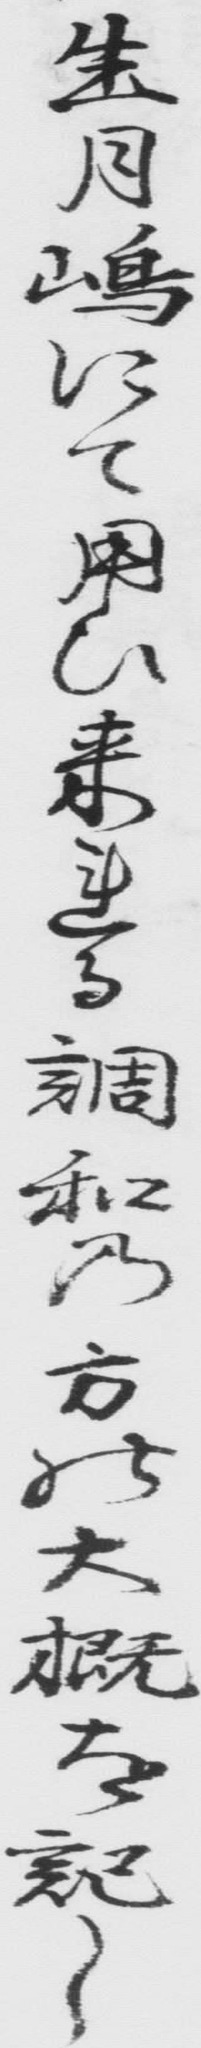生月嶋にて用ひ来れる調和の方の大概を記し
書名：鯨肉調味方
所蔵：大阪府立大学学術情報センター 国文学研究資料館
